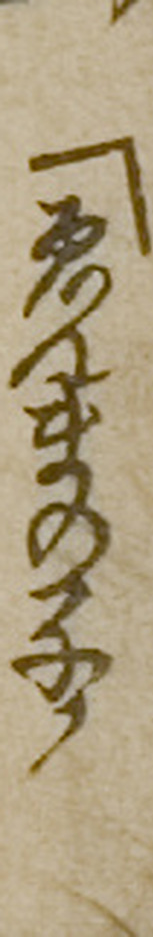〽ゑんまの子ノ
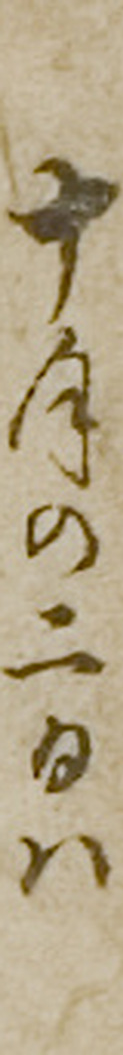十月の二日ハ
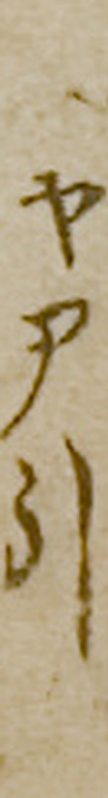ヤア引
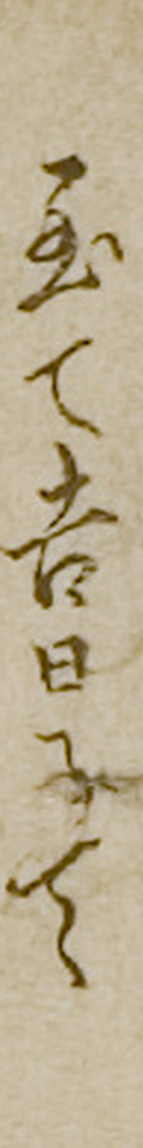至て吉日にて
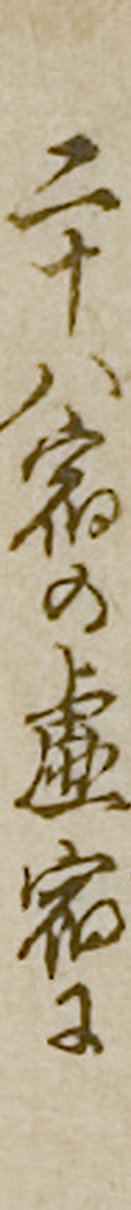二十八宿の虚宿に
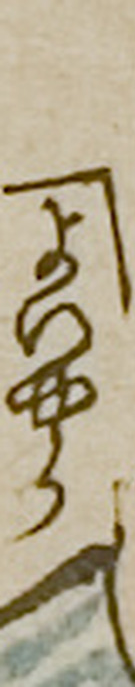〽よいやら
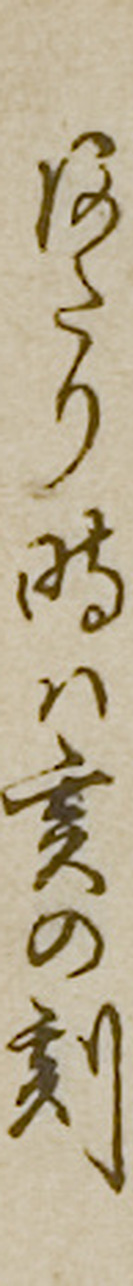あたり時ハ亥の刻
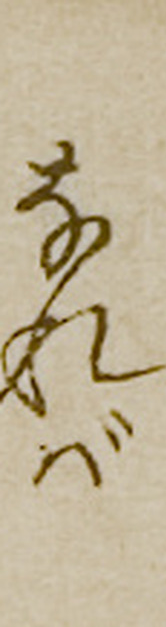なれバ
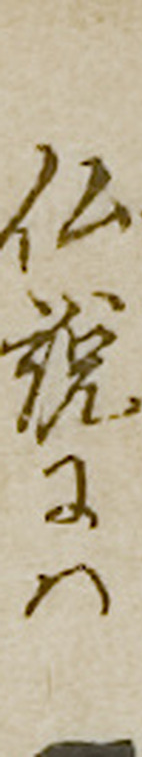仏説にハ
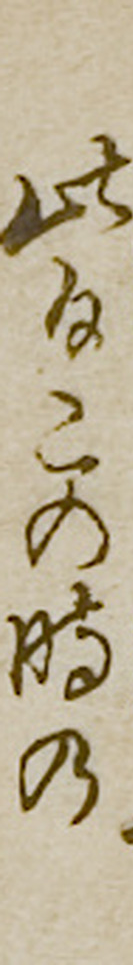此日この時の
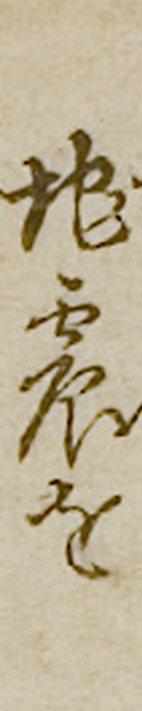地震を
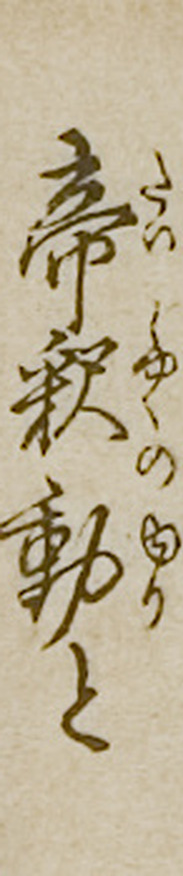帝釈動と
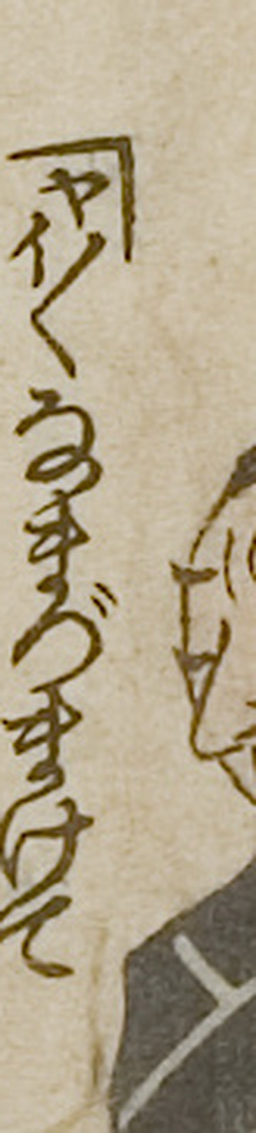〽ヤイ〳〵なまづまけて
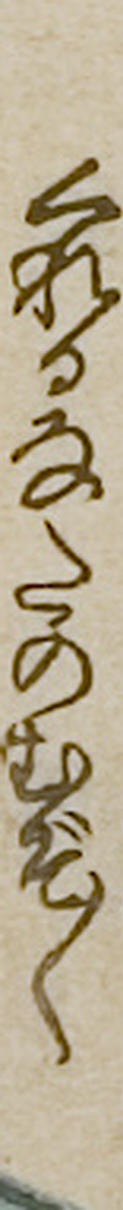くれるなたのむぞ〳〵
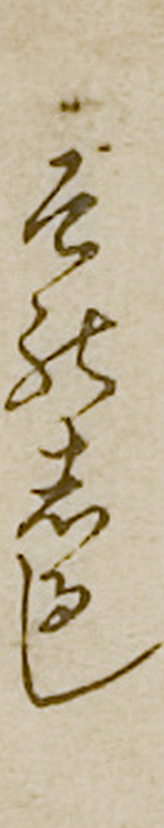そのしるし
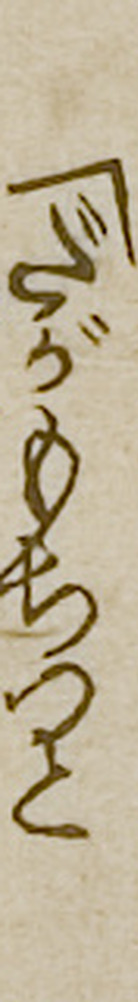〽だがもちつと
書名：[鯰と鹿島大明神の首引]
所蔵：東京大学総合図書館 General Library in the University of Tokyo, JAPAN
